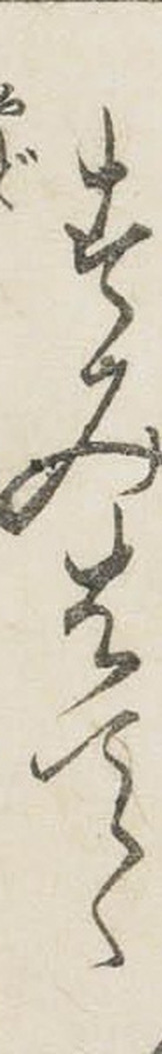すみはてゝ
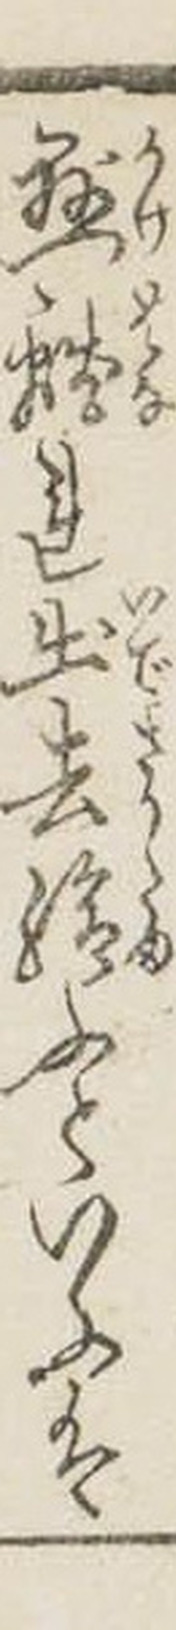懸離れ出去給ふといふは
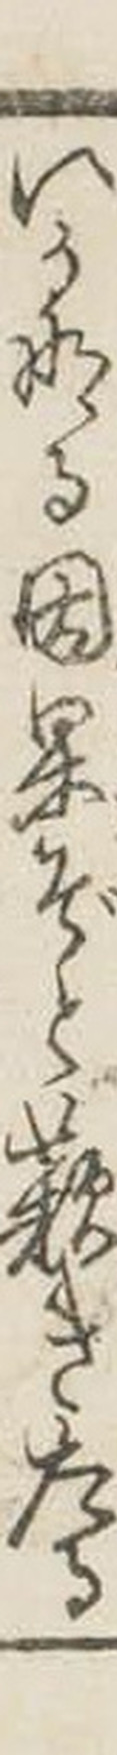いかなる因果ぞと歎きたる
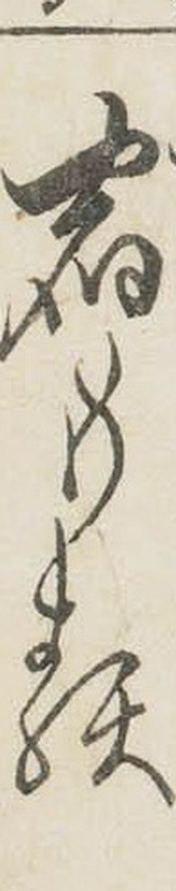宿もる
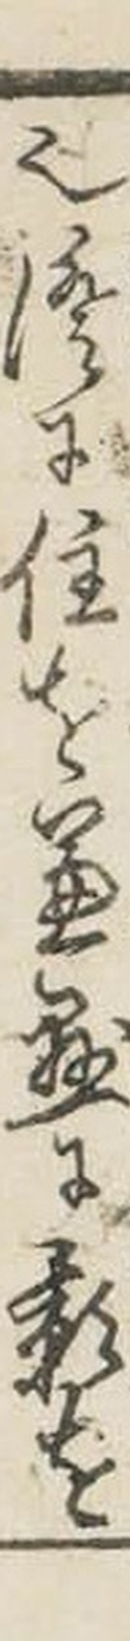也澄に住を兼懸に影を
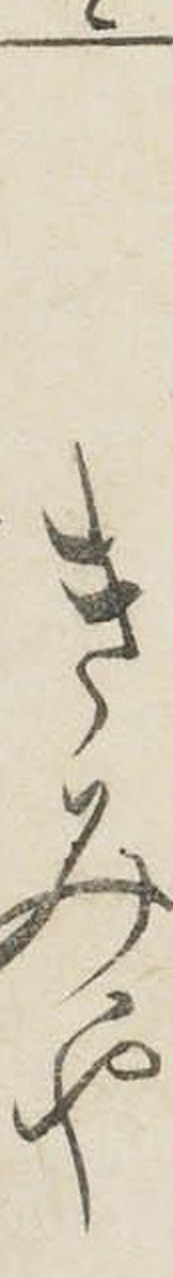きみや
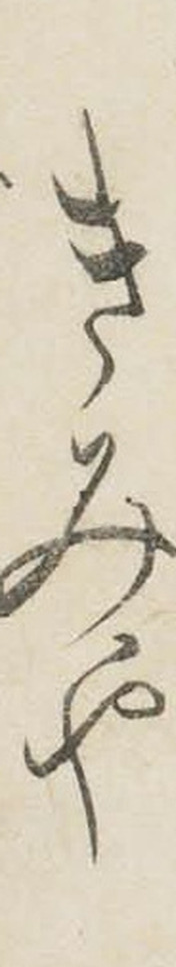きみや
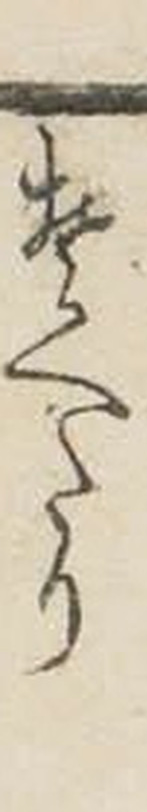そへたり
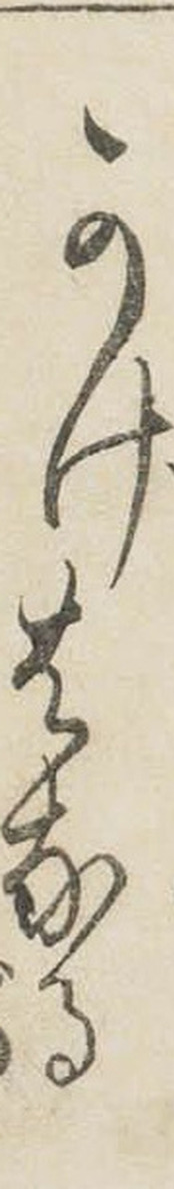かげはなる

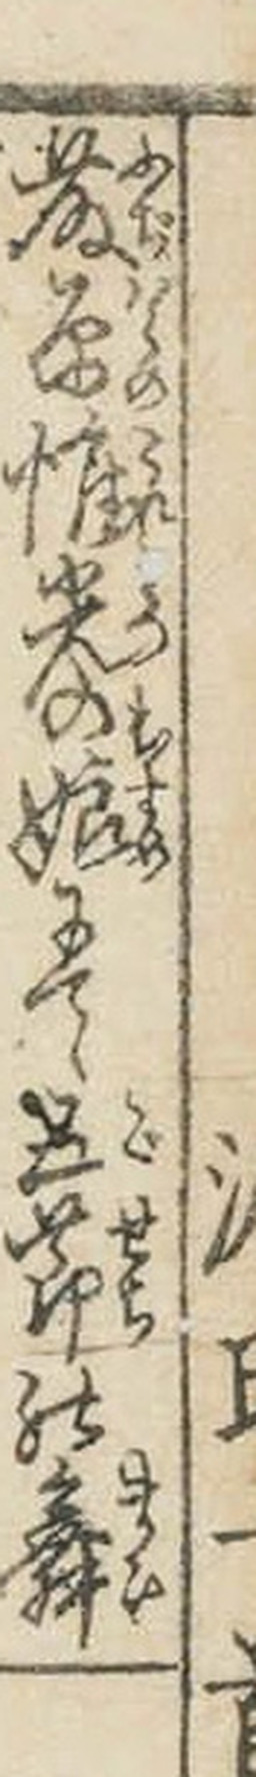藤原惟光の娘にて五節の舞
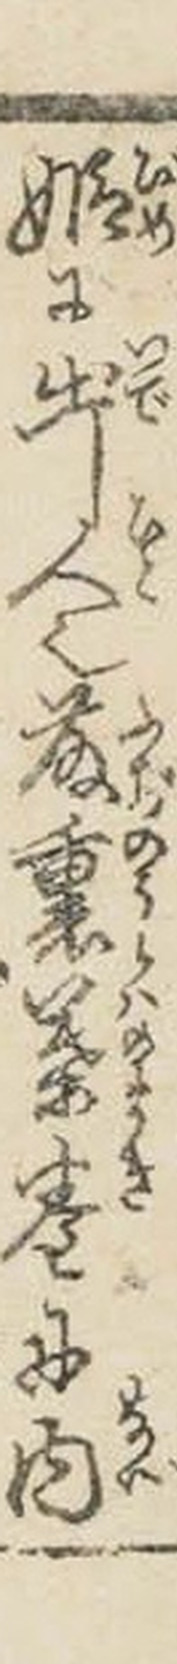姫に出し人也藤裏葉巻に内
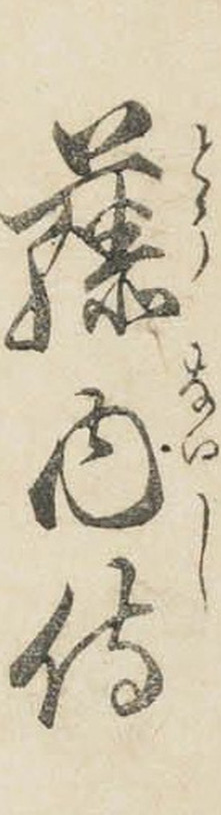藤内侍
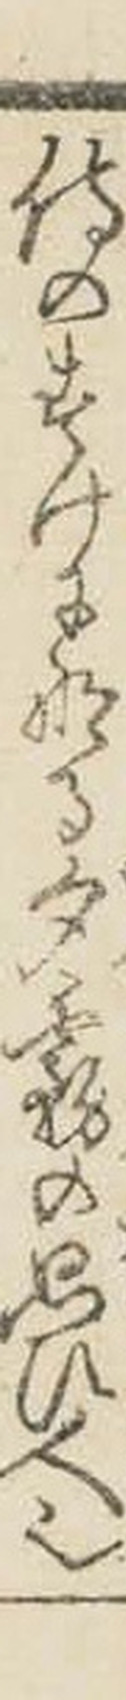侍のすけになる夕霧の思ひ人也
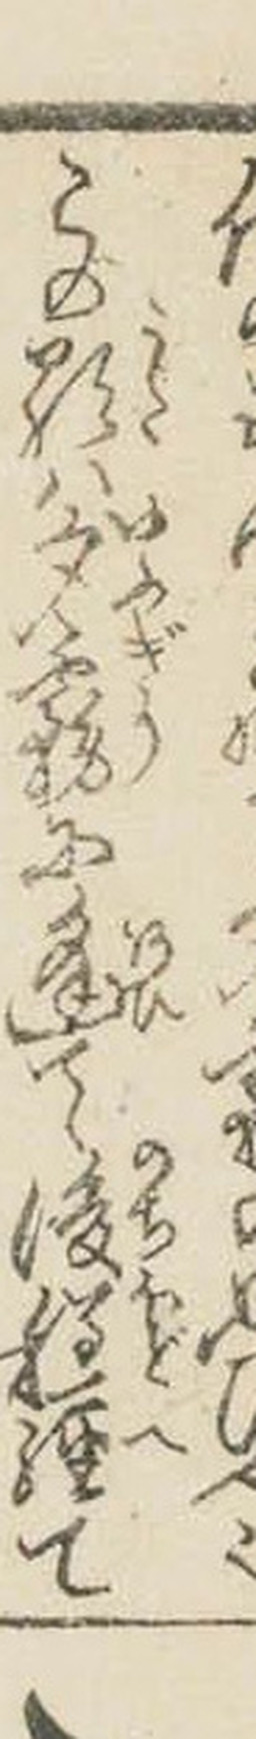この歌は夕霧に逢て後程経て
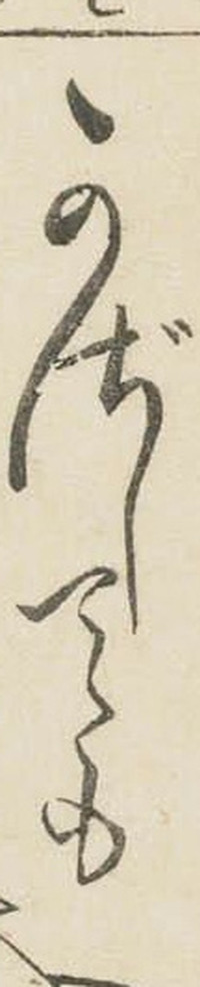かざしても
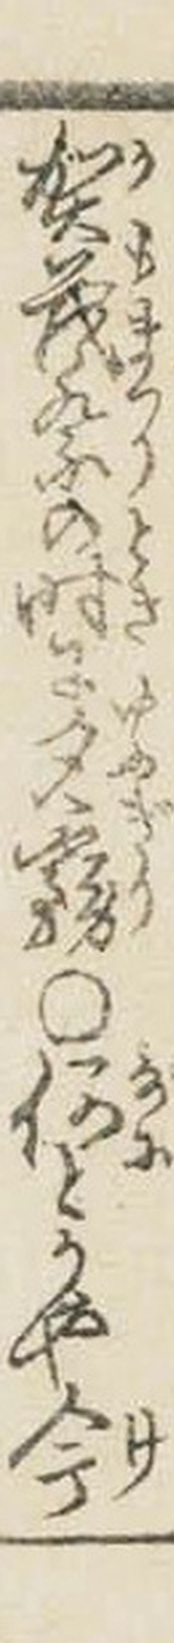加茂祭の時に夕霧○何とかや今
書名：源氏百人一首
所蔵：東京学芸大学教育コンテンツアーカイブ
